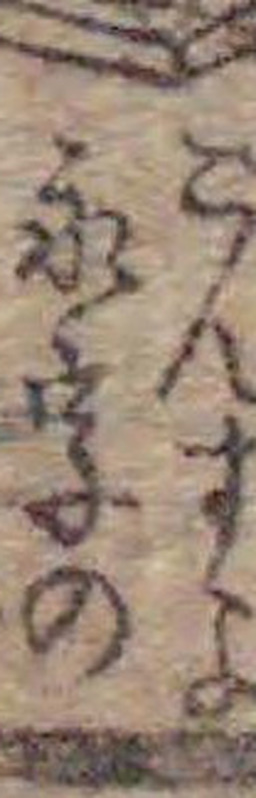永字の
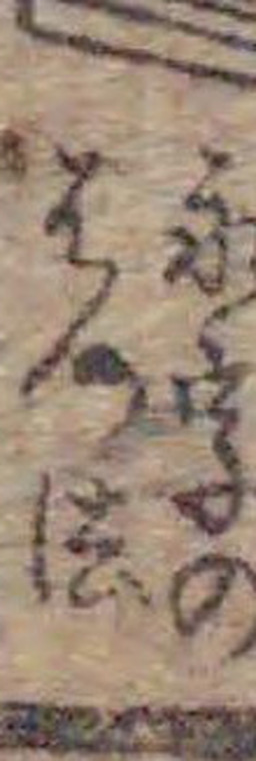はつ法
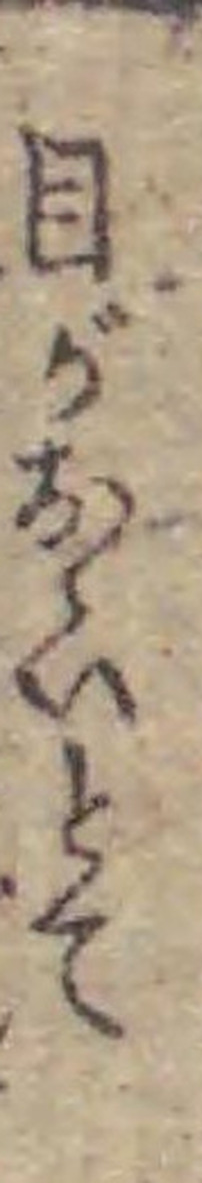目がおゝいとて
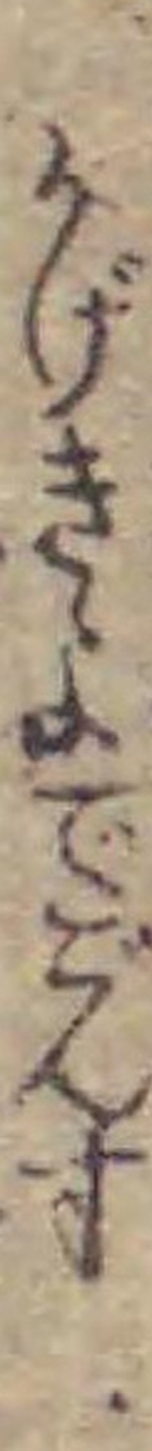かげきよでごんす
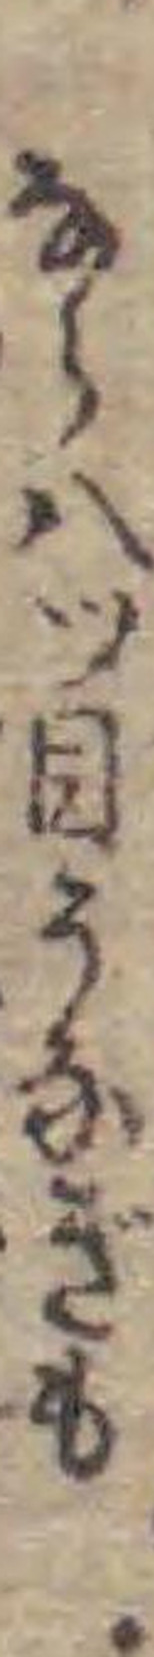なら八つ目うなぎも
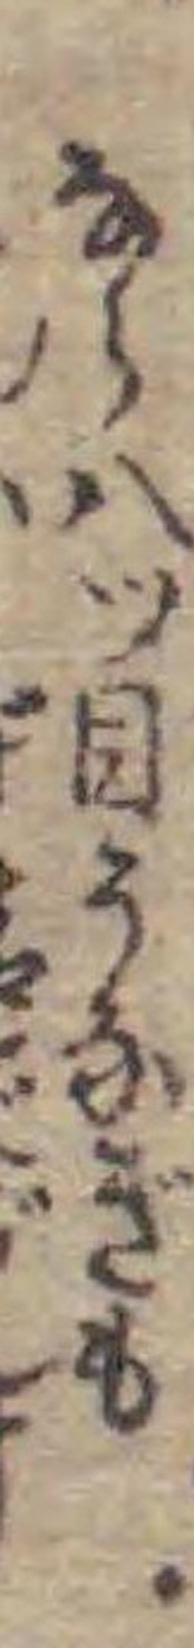なら八つ目うなぎも
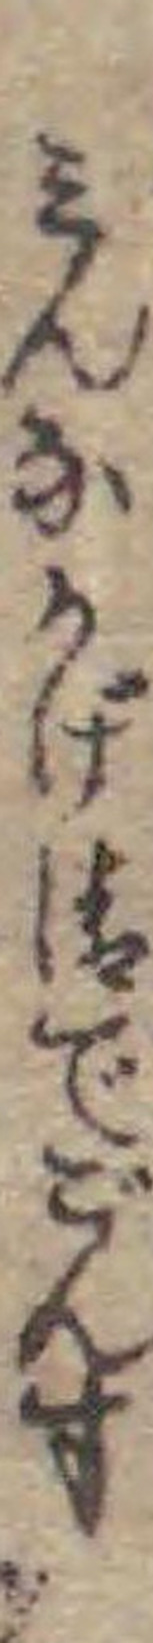みんなかげ清でごんす
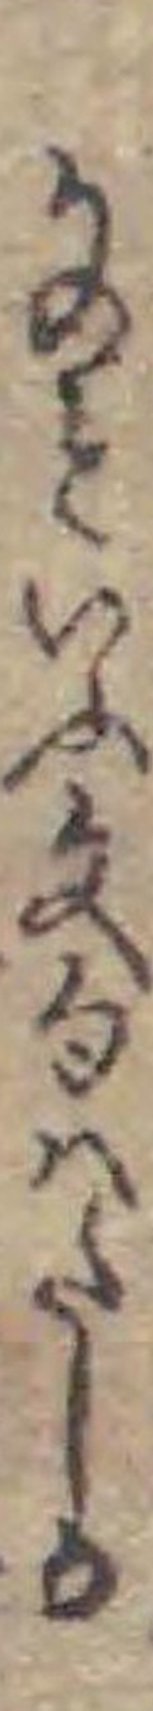かのといふ文句はたしか
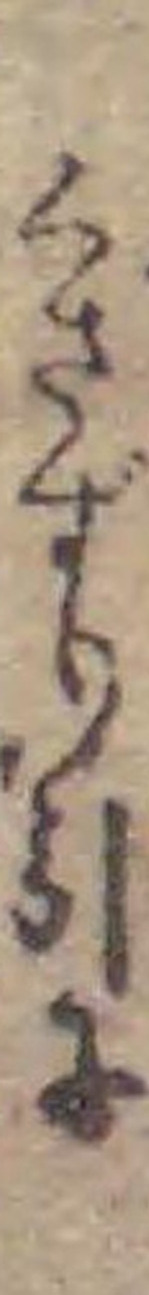くさずり引に
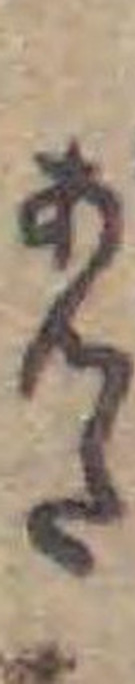あつた

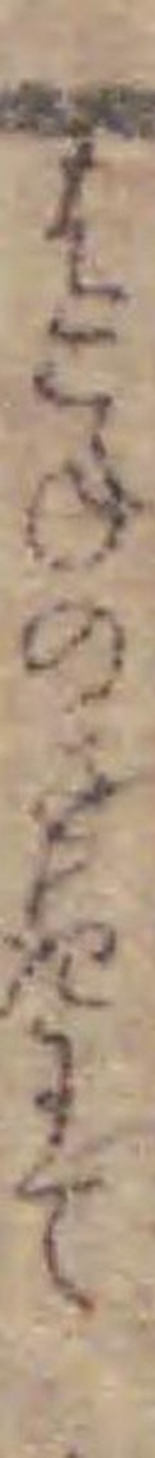はこねのさきにて
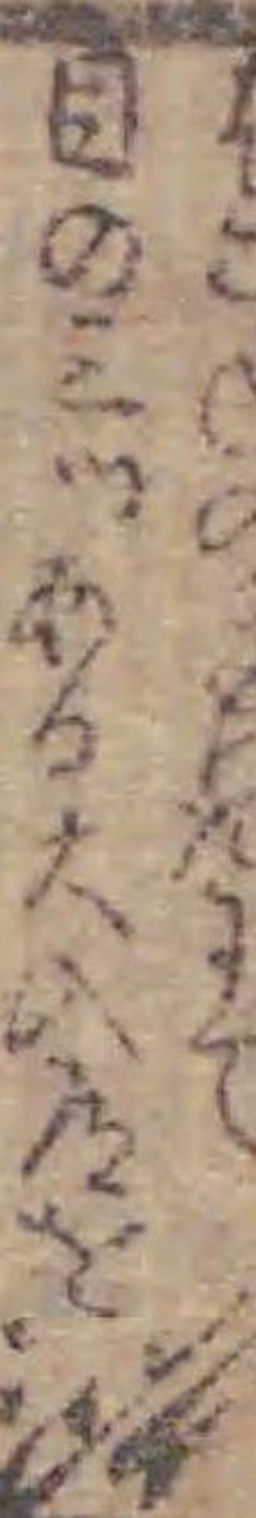目の三つある大入道を
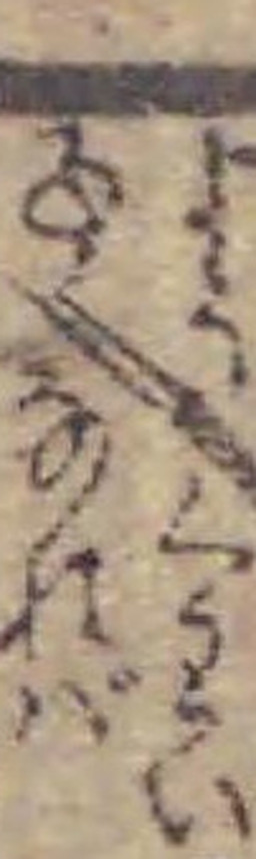事なれば
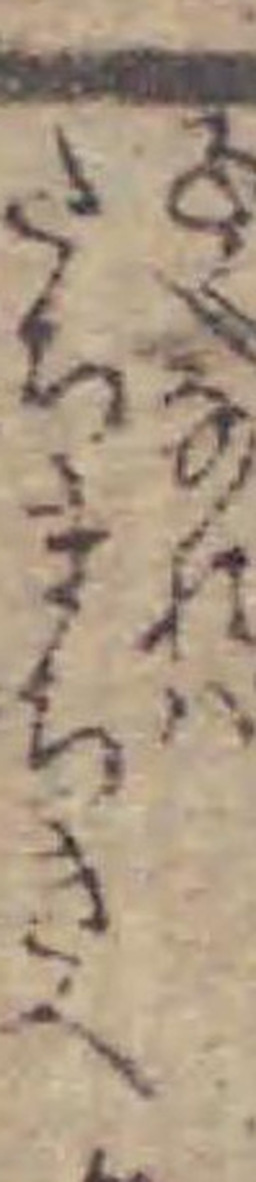たちまちきへ
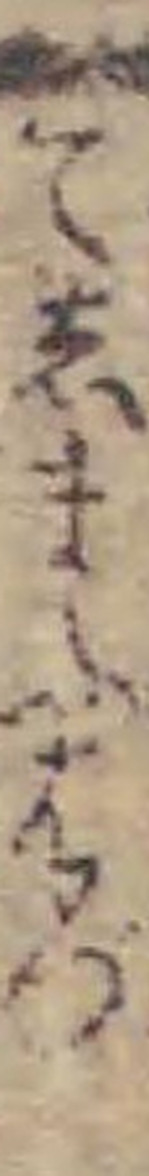てしまふはづ
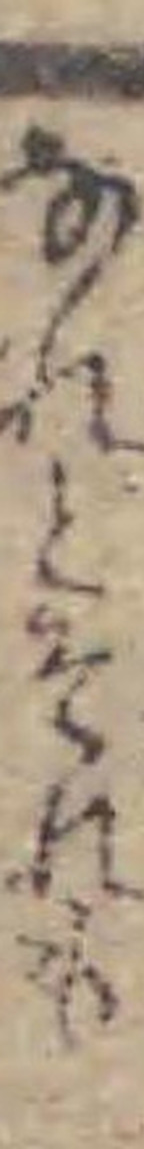なれどそれも
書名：悪七変目景清 : 2巻
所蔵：国立国会図書館 National Diet Library, JAPAN
